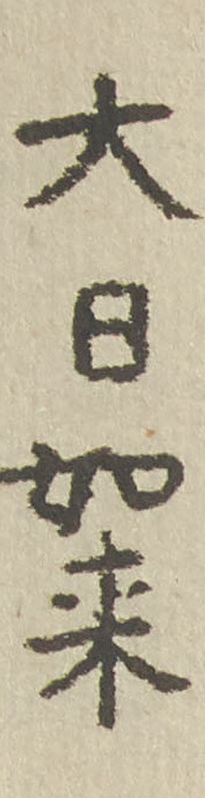大日如来
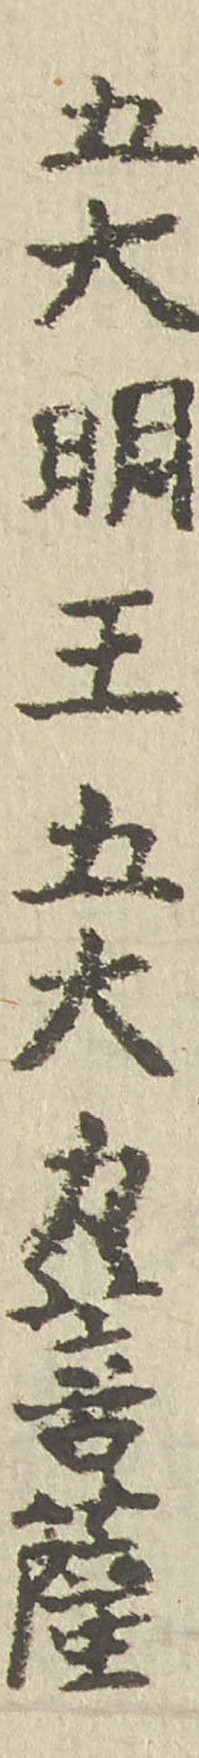五大明王五大力菩薩
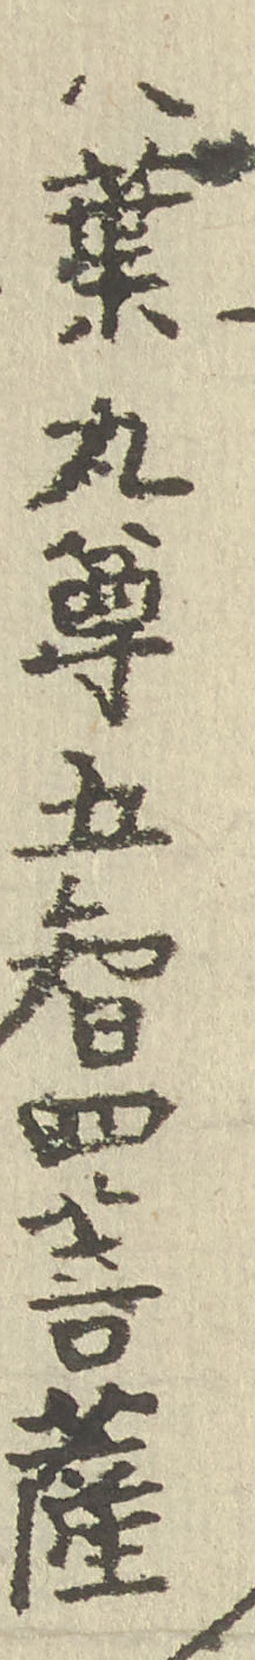八葉九尊五智四菩薩
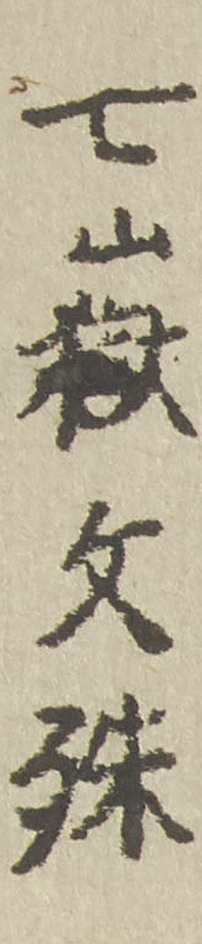七嶽文殊
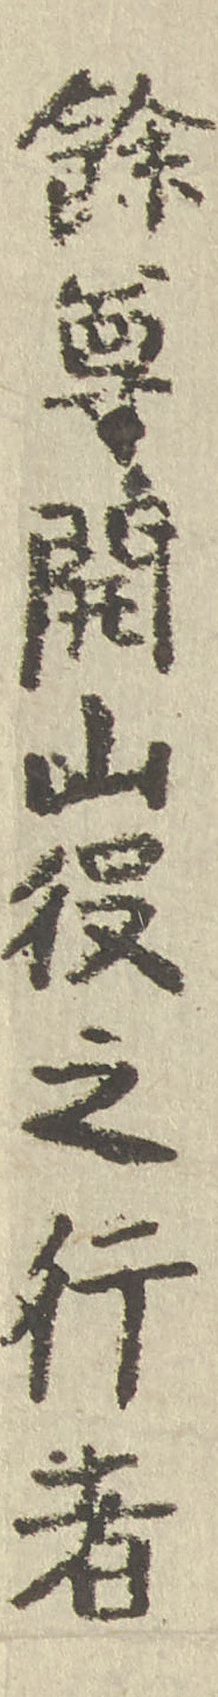余尊開山役行者
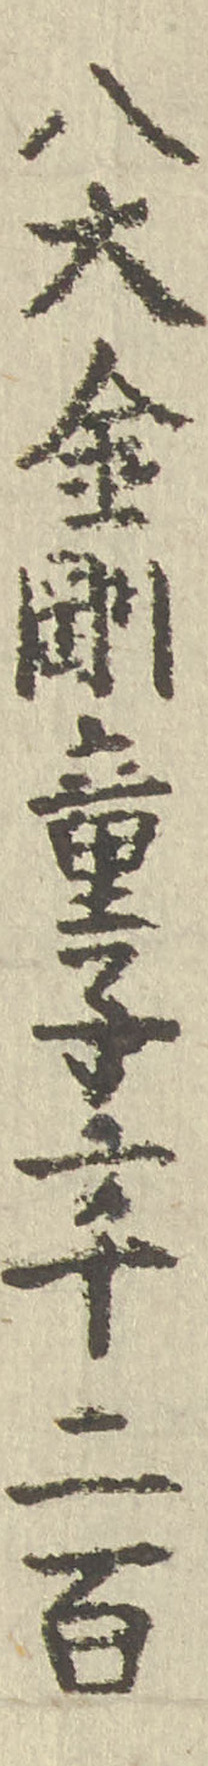八大金剛童子二千二百
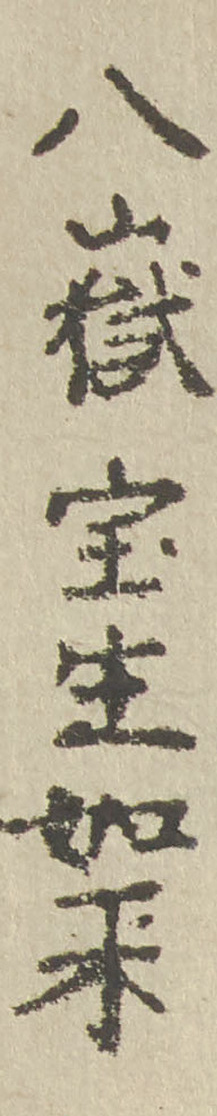八嶽宝生如来
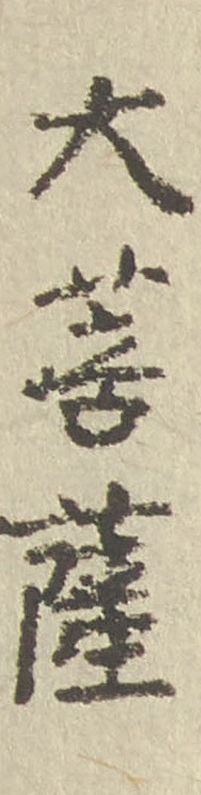大菩薩
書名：三国第一富士山禅定図
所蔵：東京大学総合図書館 General Library in the University of Tokyo, JAPAN
